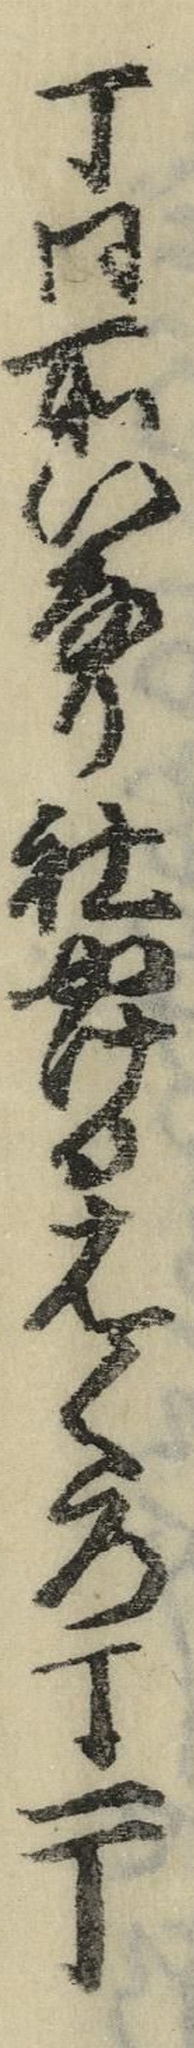丁同所いなり社やけるはくろ丁一丁
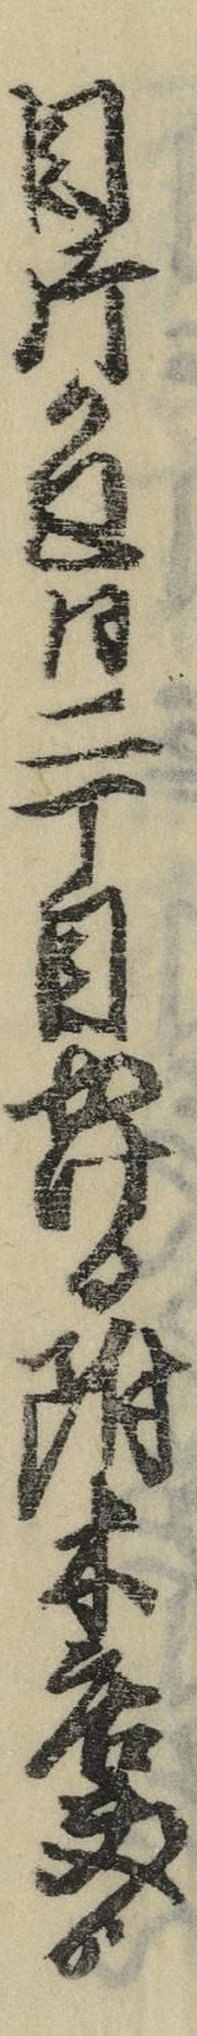同所同二丁目やける附木店夫ゟ
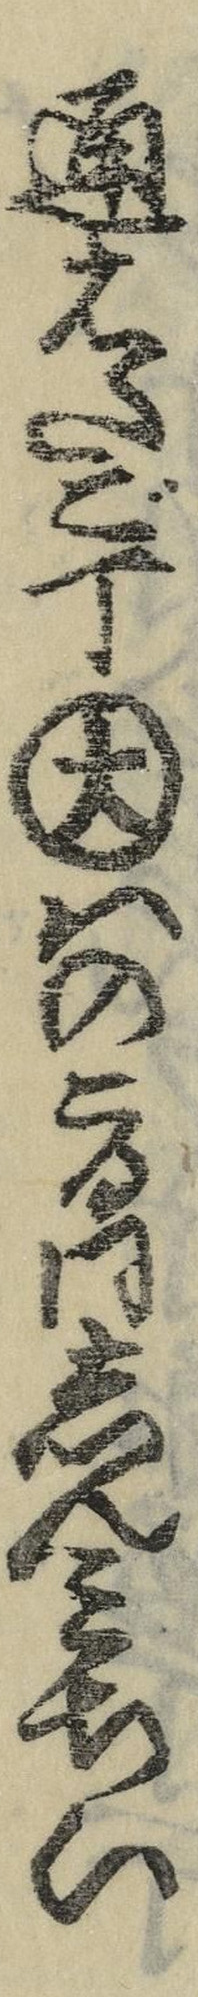通はたご丁大はのこる同しんみちい
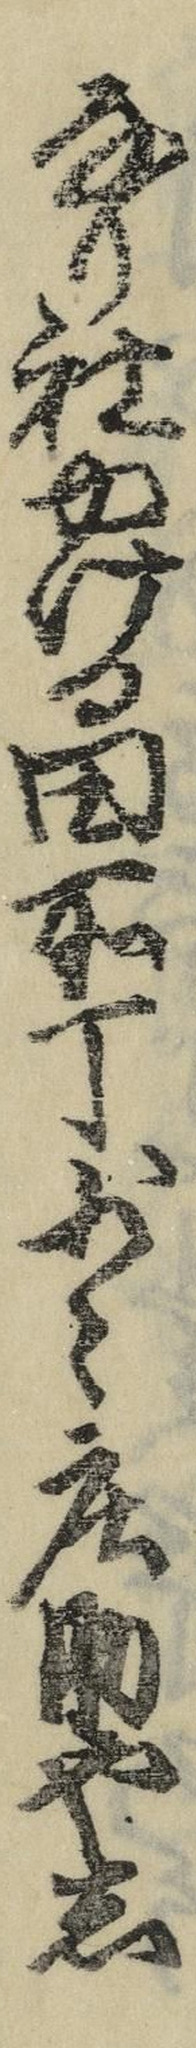なり社やける田所丁少々庄助やし
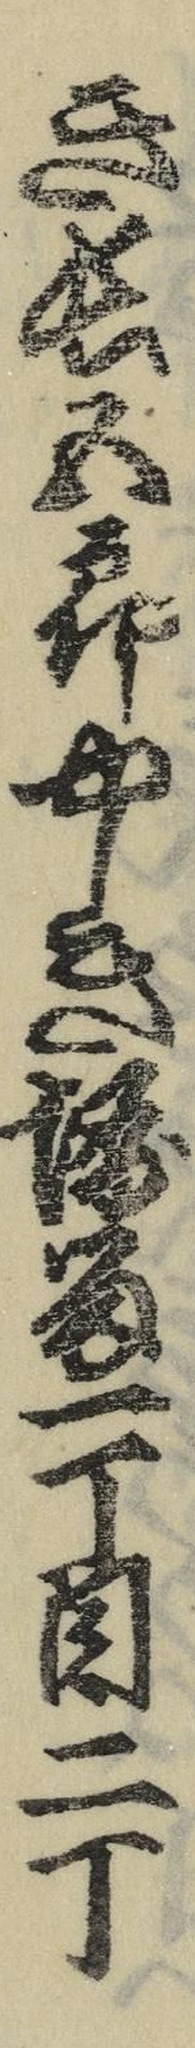き長五郎やしき堀留一丁目二丁
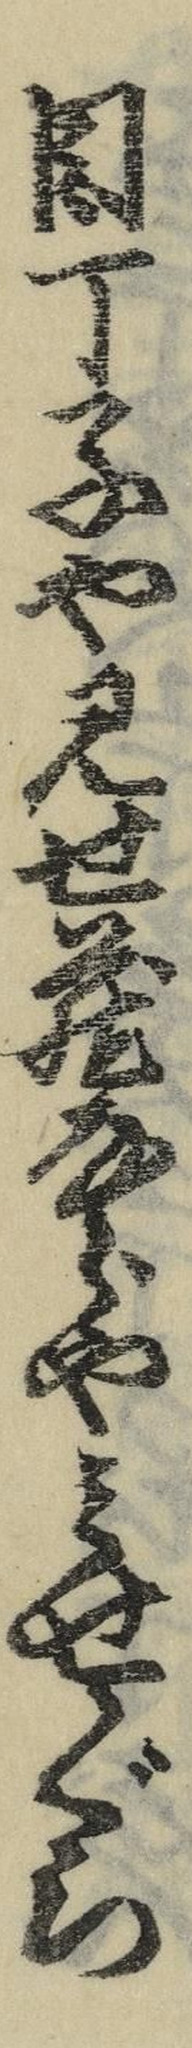目丁子や見せ蔵ならやみせぐら
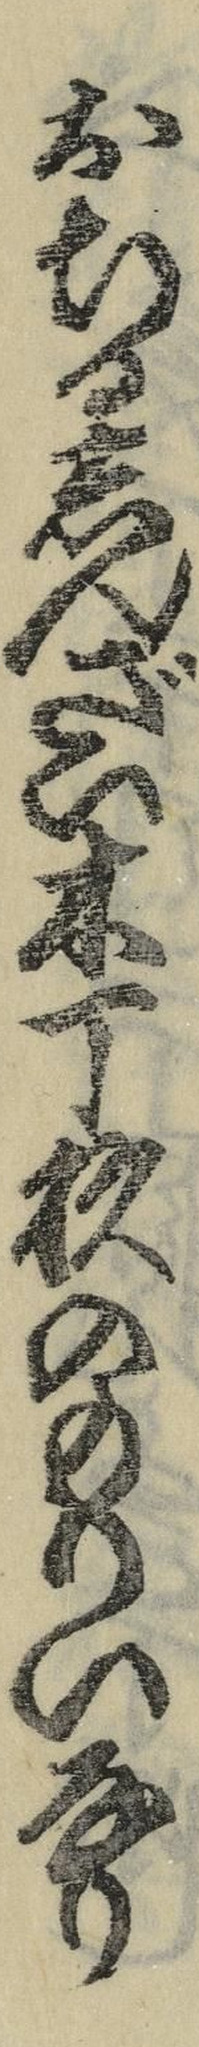おちるしんざい木丁杉のもりいなり
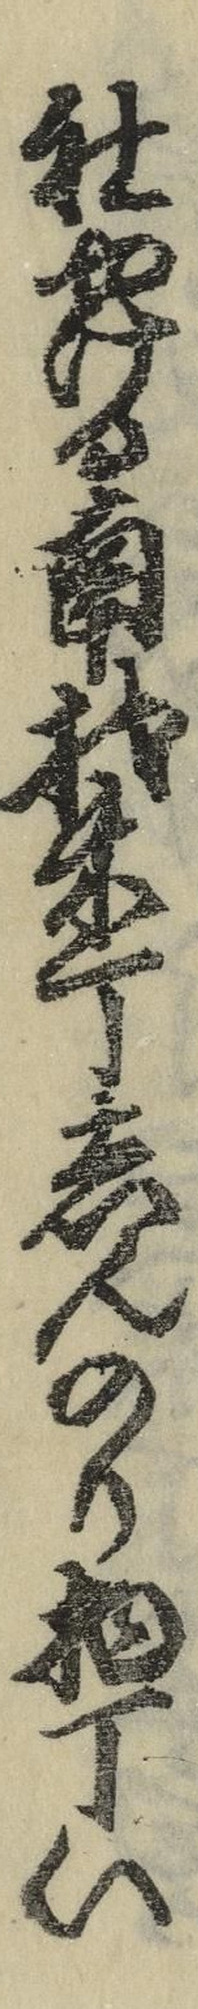社やける南材木丁しんのり物丁い
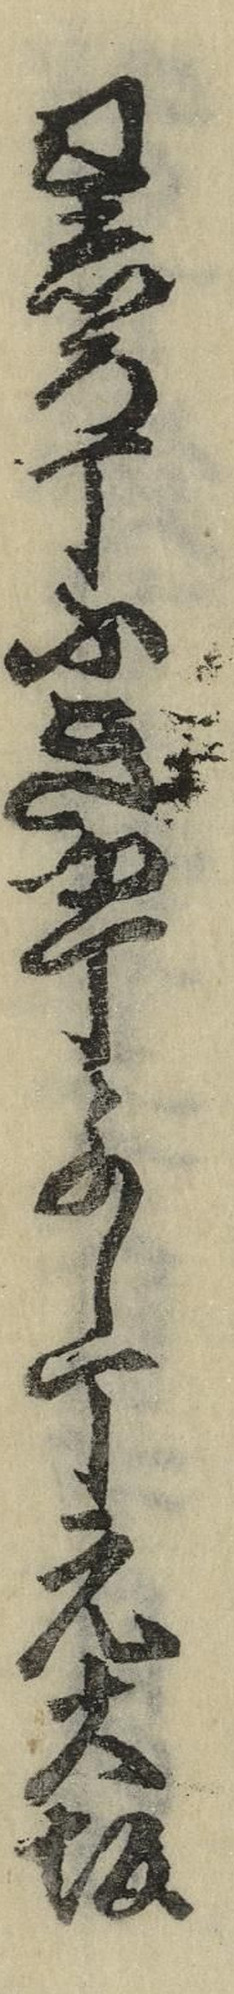わしろ丁ふきや丁ふし丁元大坂
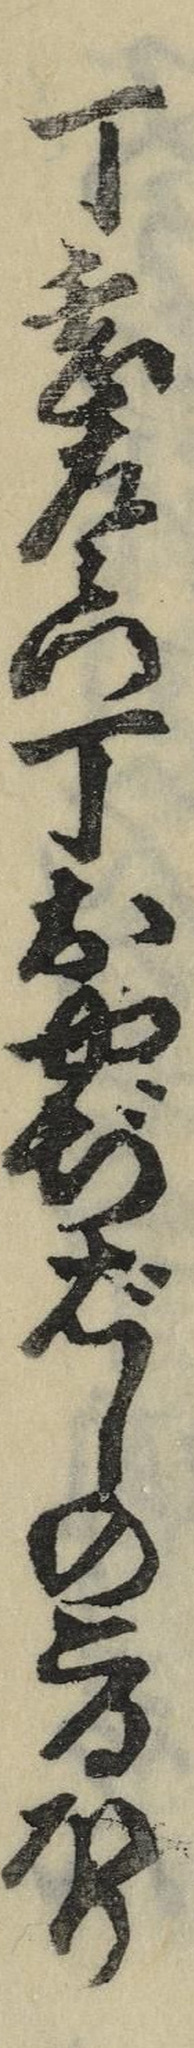丁甚左衛門丁おやぢばしの方ほり

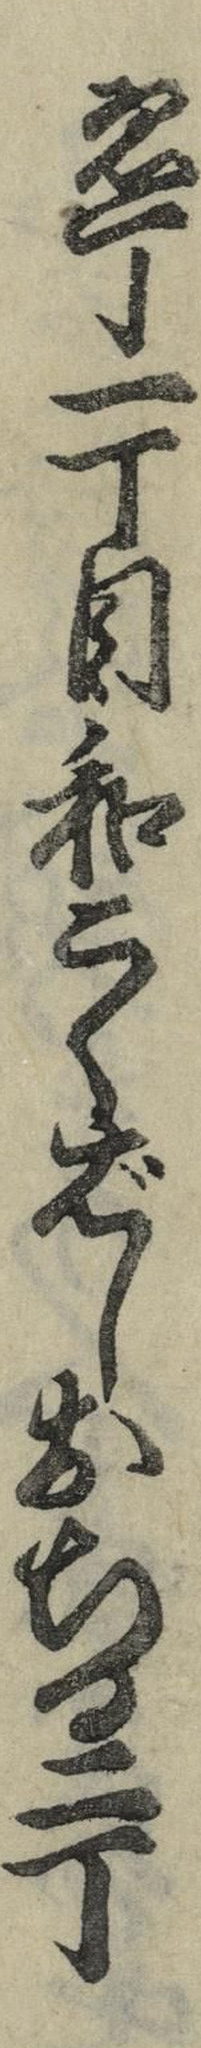ゑ丁一丁目和こくばしおちる二丁
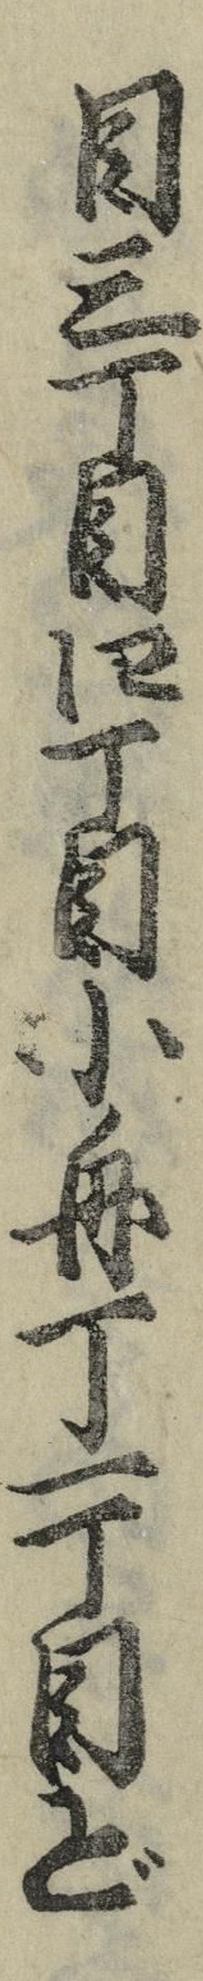目三丁目四丁目小舟丁一丁目ど
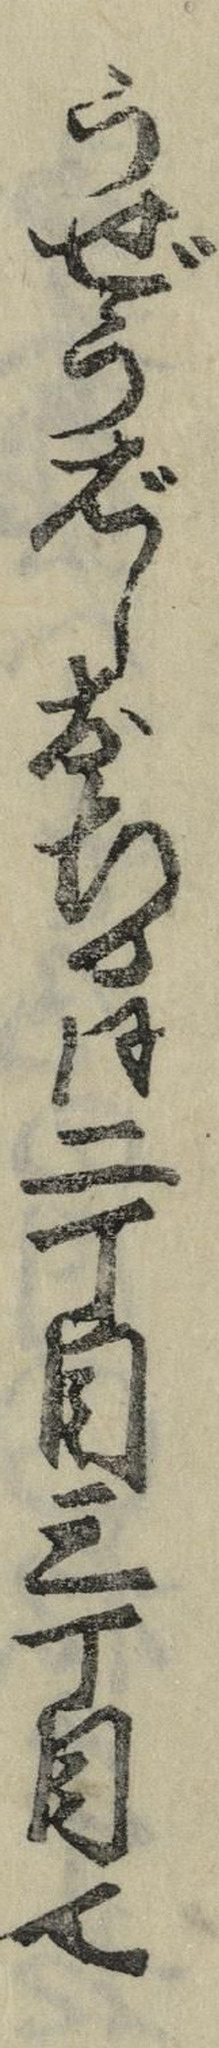うぜうばしおちる同二丁目三丁目て
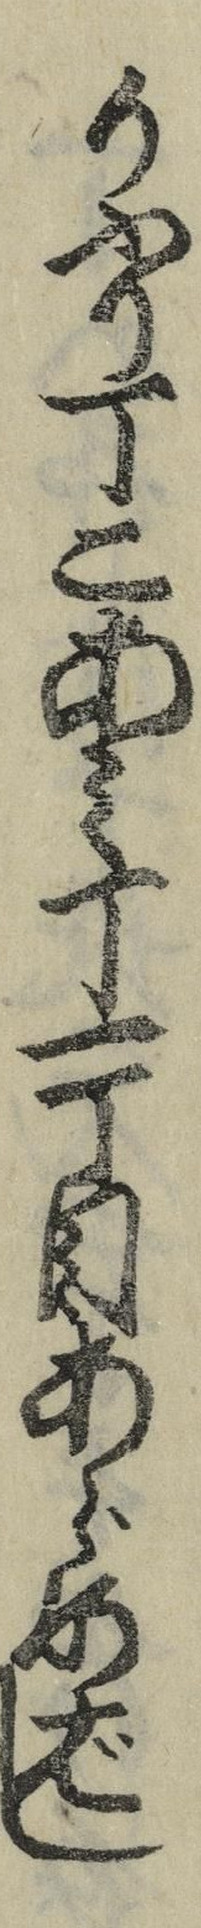りふり丁こあみ丁一丁目あらめばし
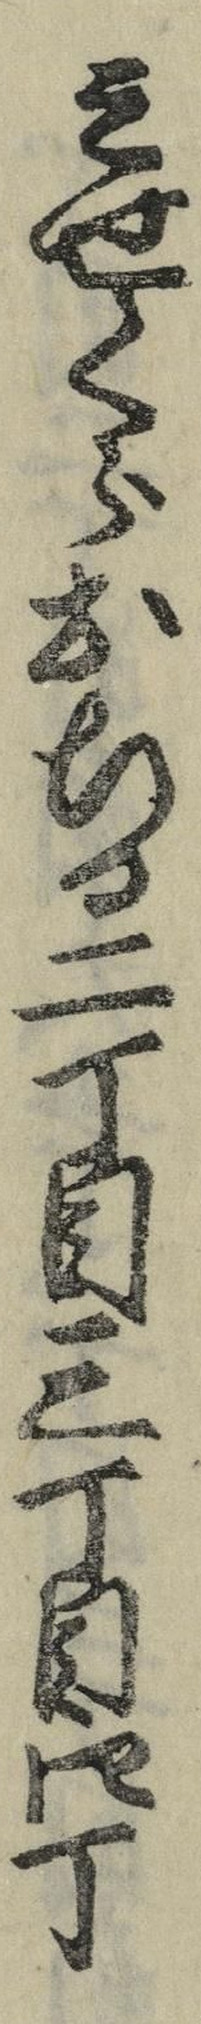みせくらおちる二丁目三丁目四丁
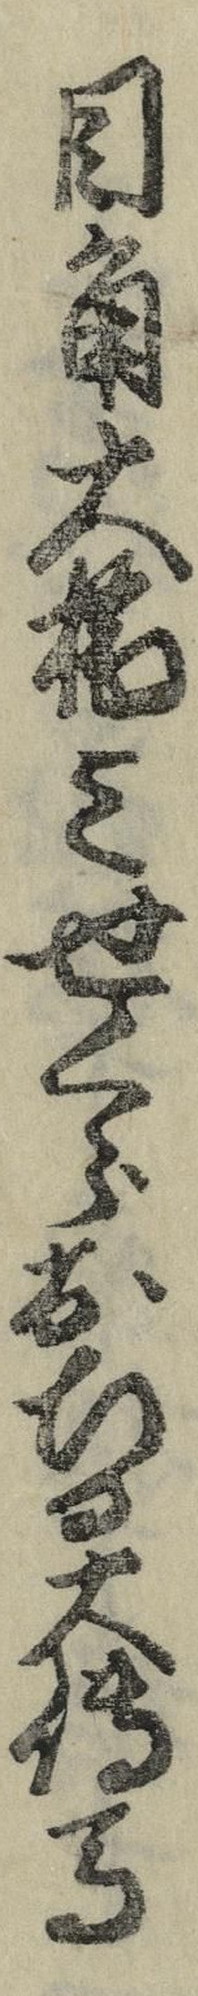目角大橋みせくらおちる大伝馬
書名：大江戸焼場所明細之写　附出火方角画圖　戊午安政五年十一月十五日
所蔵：東京大学地震研究所図書室 Earthquake Research Institute Library, The University of Tokyo, JAPAN
